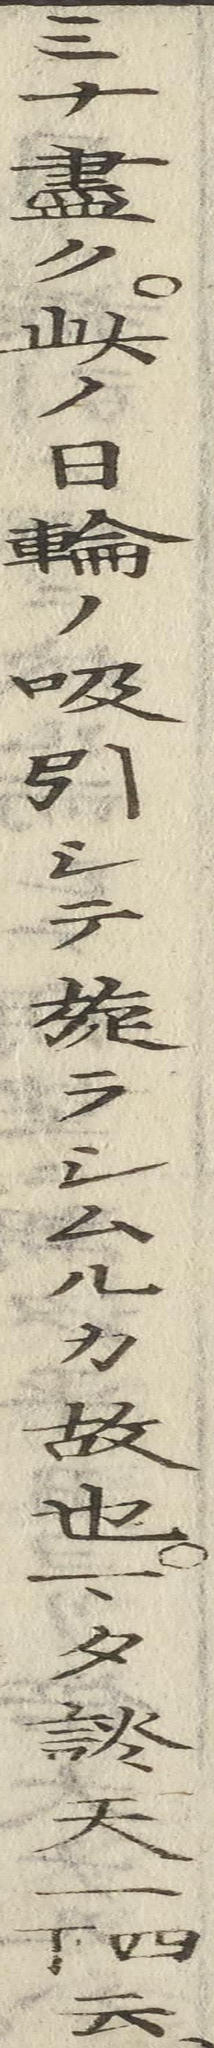ミナ尽ク。此ノ日輪ノ吸引シテ旋ラシムルカ故也。マタ談天一四丁云。
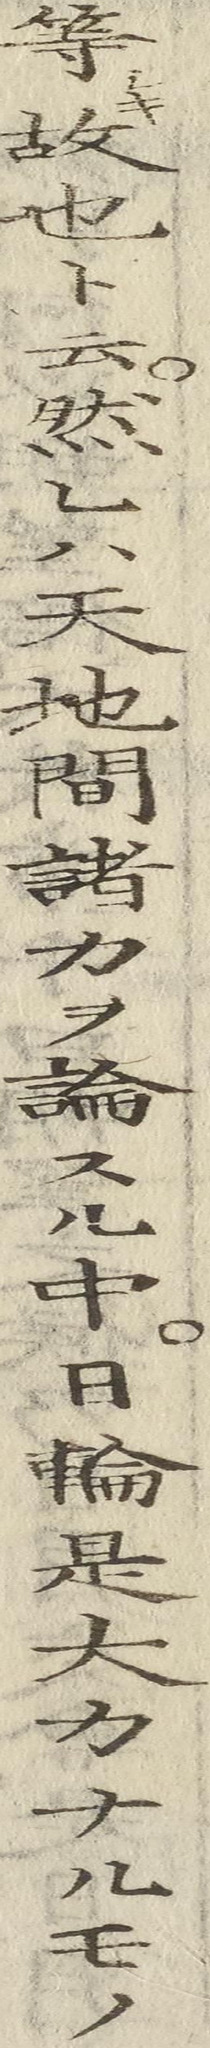等故也ト云。然レハ天地間諸カヲ論スル中。日輪是大カナルモノ
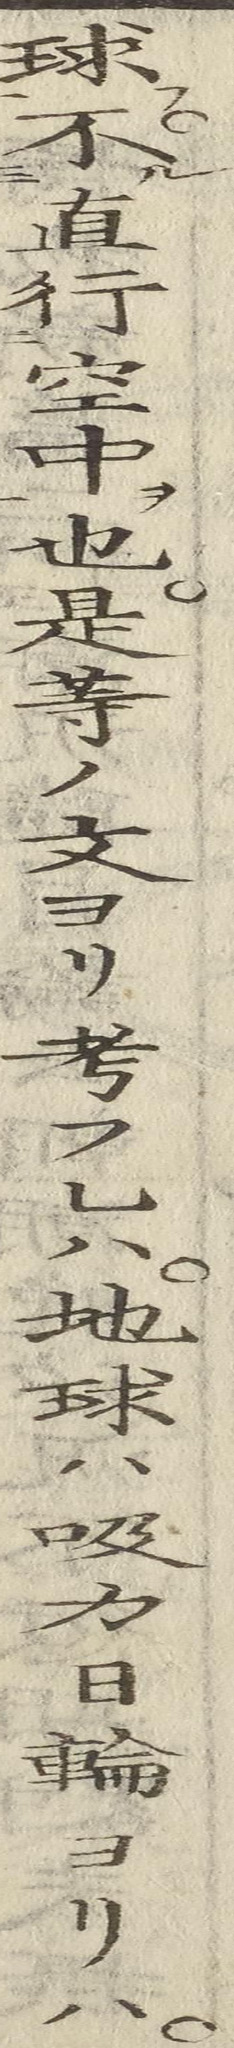球。不直行空中也。是等ノ文ヨリ考フレハ。地球ハ吸カ日輪ヨリハ。

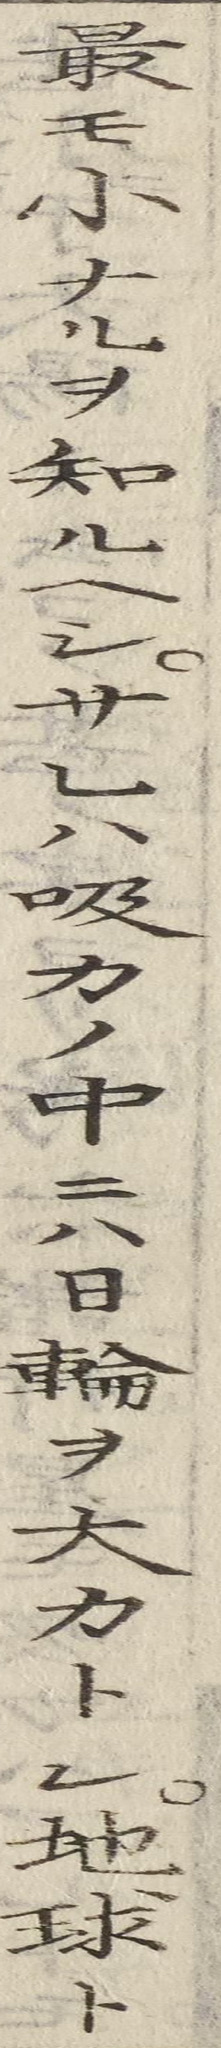最モ小ナルヲ知ルヘシ。サレハ吸カノ中ニハ日輪ヲ大カトシ。地球ト
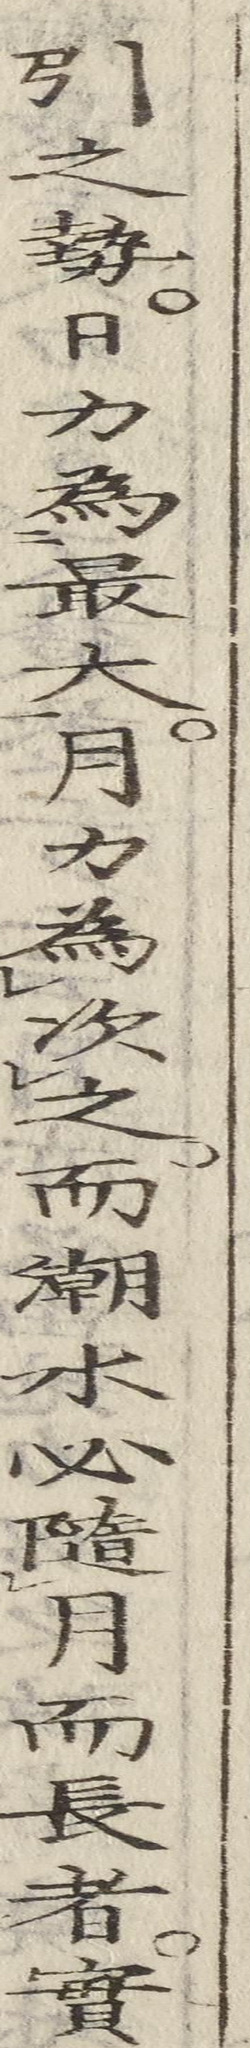引之勢。日カ為最大。月カ為次之。而潮水必随月而長者。実
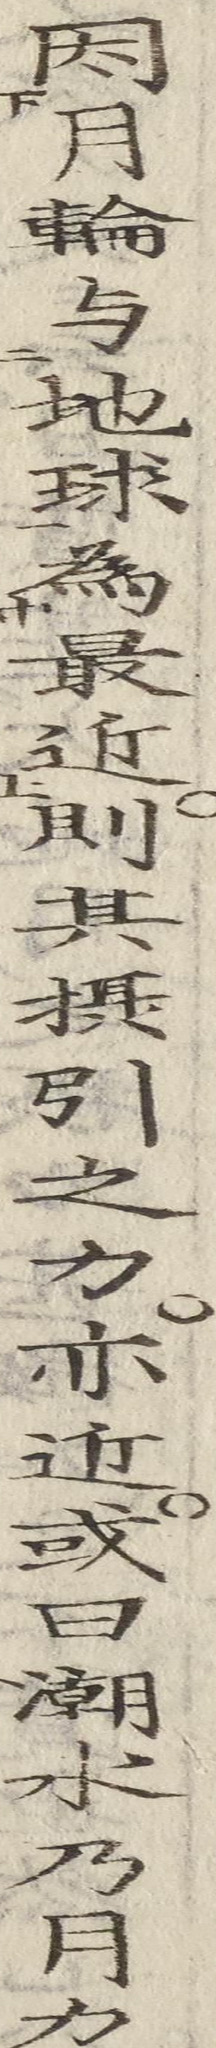因月輪与地球為最近。則其摂引之カ。亦近。或曰潮水乃月カ
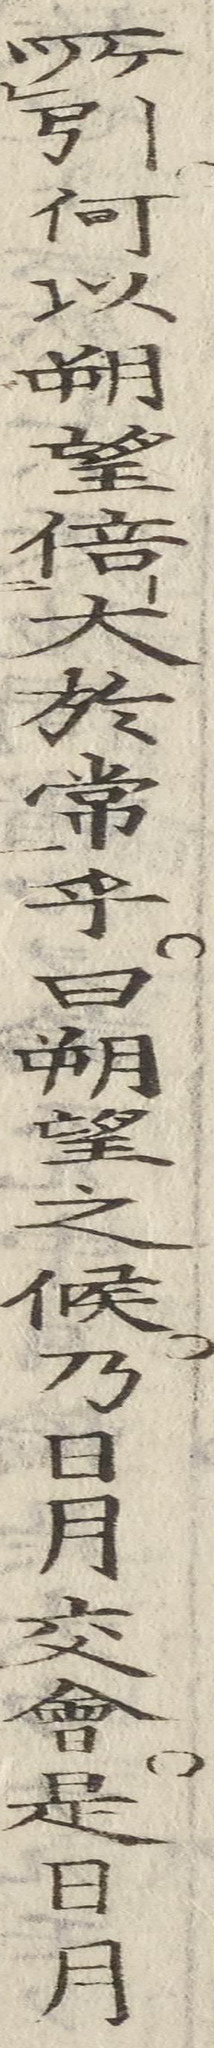所引何以朔望倍－大於常乎。曰朔望之候。乃日月交会。是日月
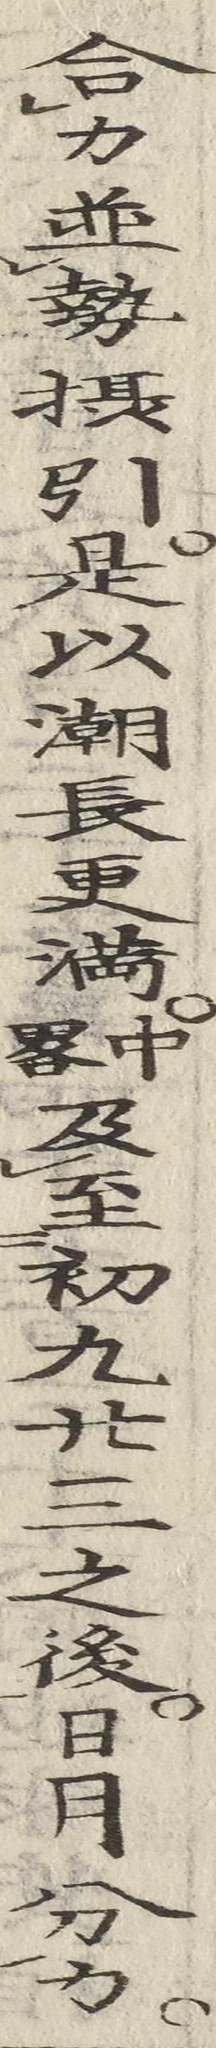合カ並勢摂引。是以潮長更満。中略及至初九廿三之後。日月分カ。
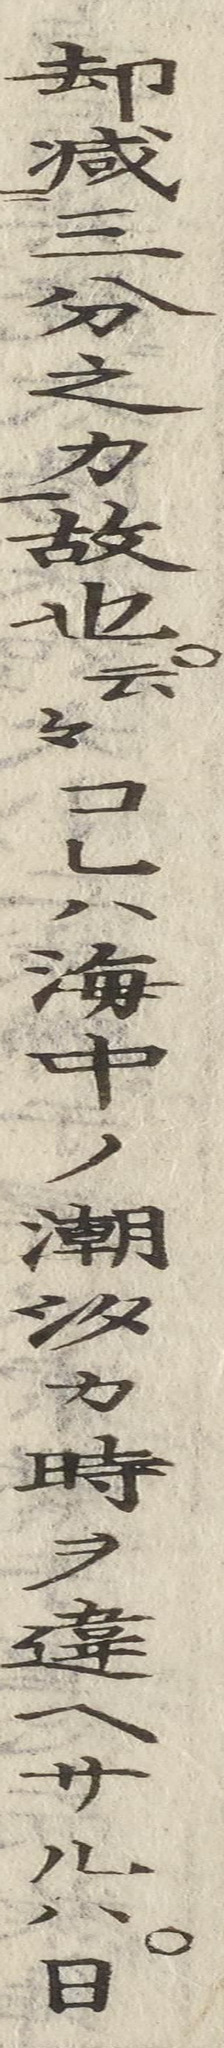却滅三分之カ故也。云々。コレハ海中ノ潮汐カ時ヲ違ヘサルハ。日
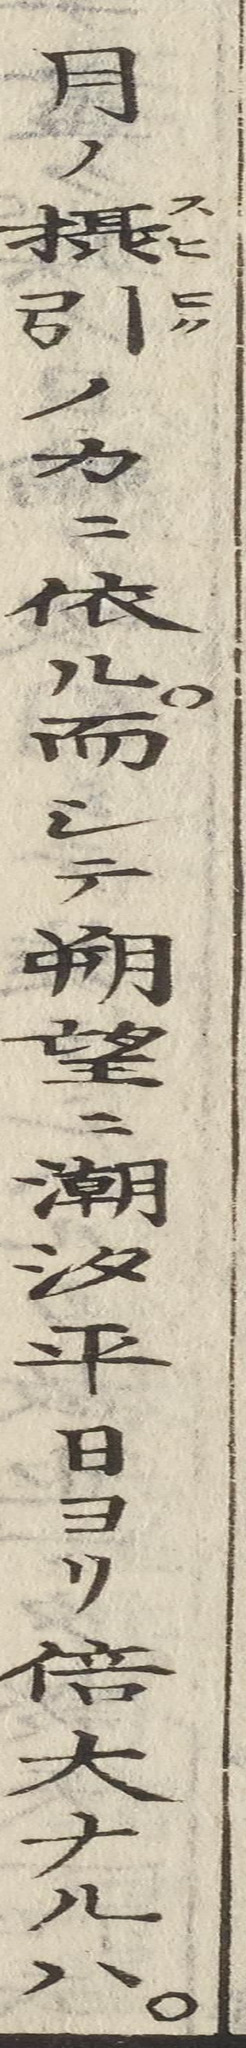月ノ摂引ノカニ依ル。而シテ朔望ニ潮汐平日ヨリ倍大ナルハ。
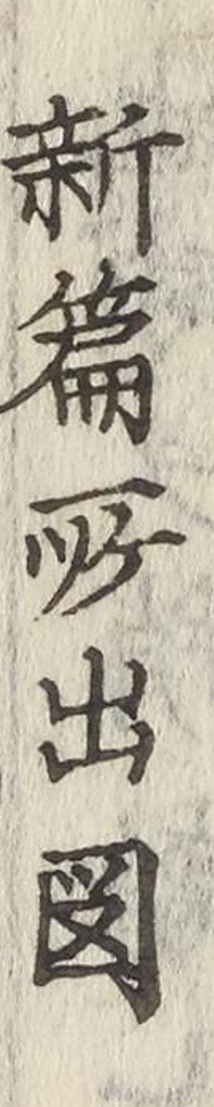新篇所出図
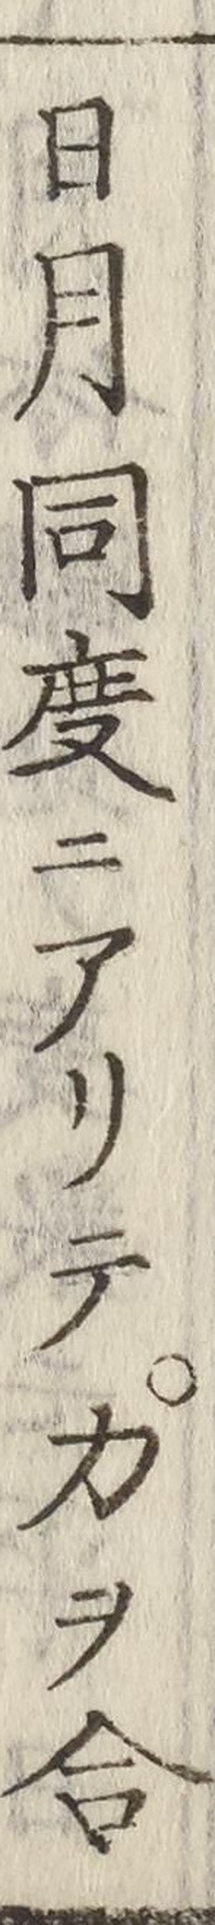日月同度ニアリテ。カヲ合
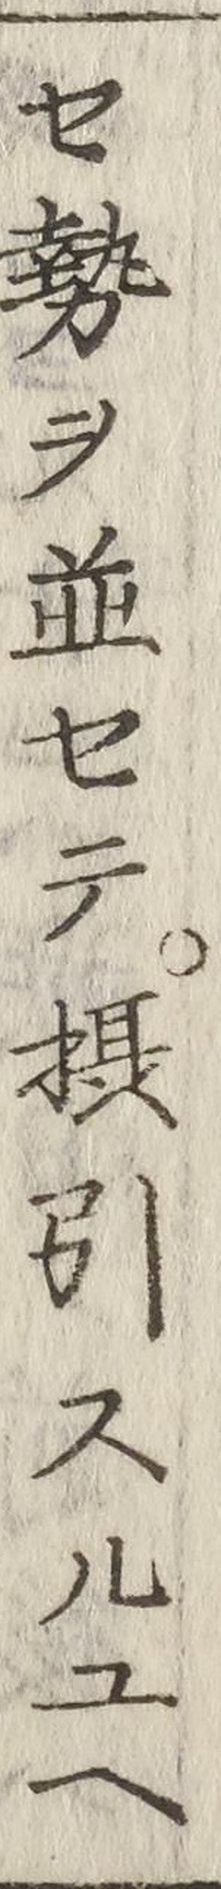セ勢ヲ並セテ。摂引スルユヘ
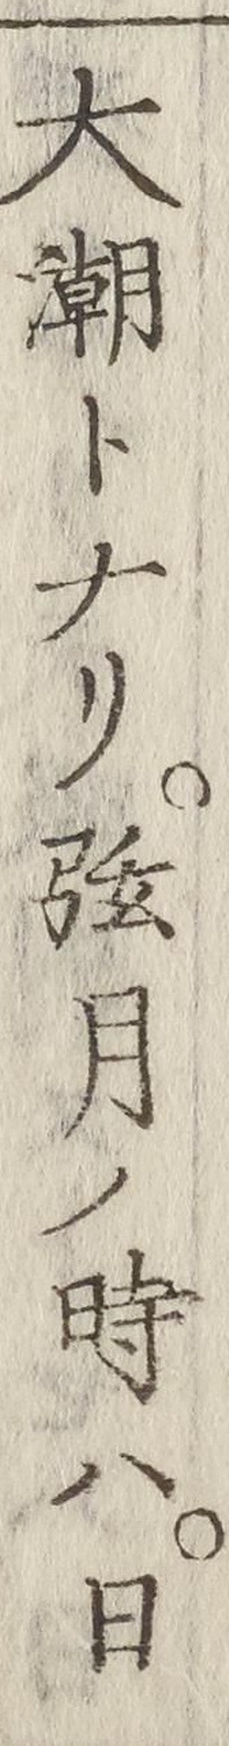大潮トナリ。弦月ノ時ハ。日
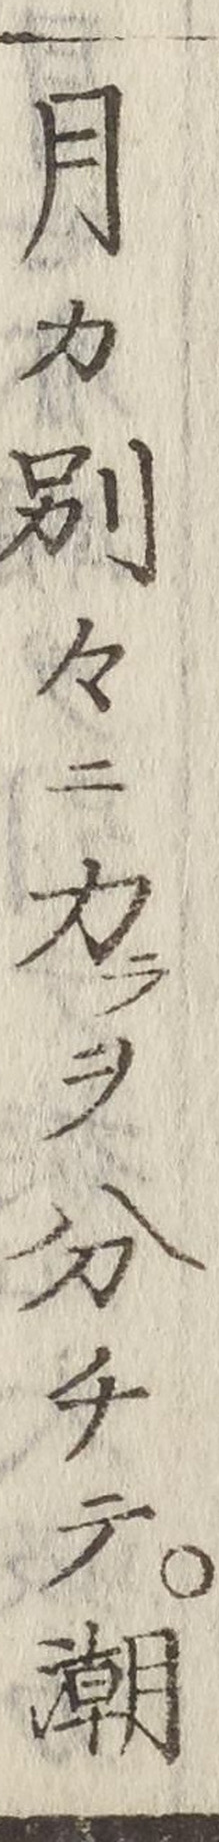月カ別々ニカ分チテ。潮
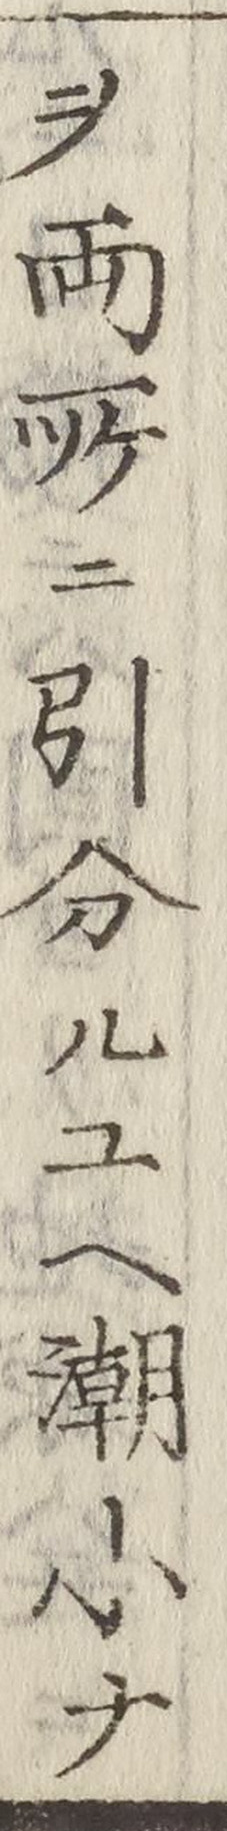ヲ両所ニ引分ルユヘ潮小ナ
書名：護法新論　中
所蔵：東京大学地震研究所図書室 Earthquake Research Institute Library, The University of Tokyo, JAPAN
